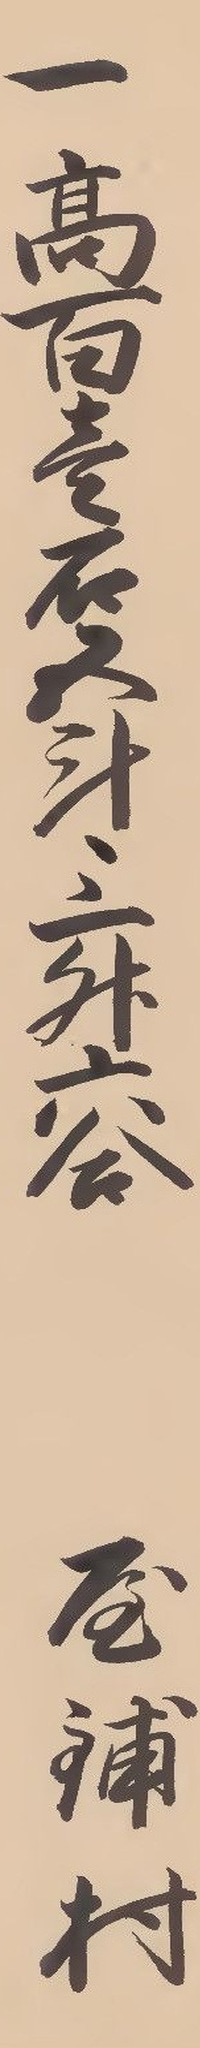一高百壱石五斗三升六合屋鋪村
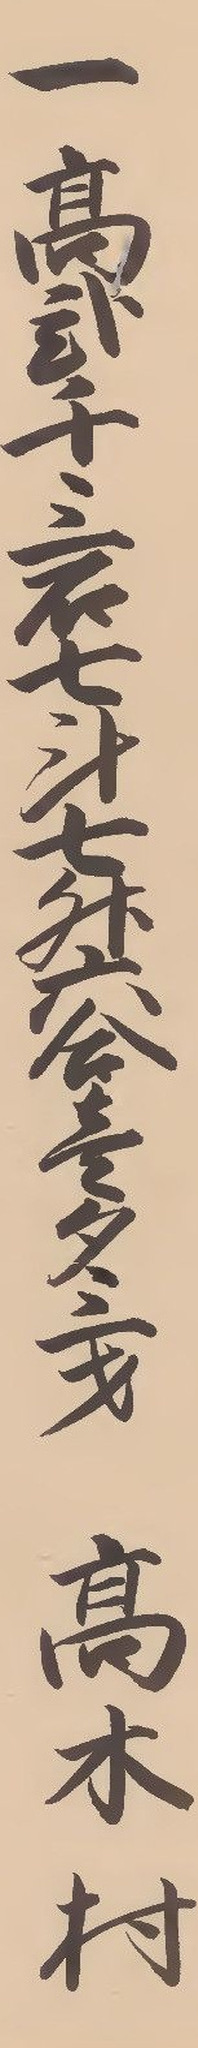一高弐千三石七斗七升六合壱勺三才高木村
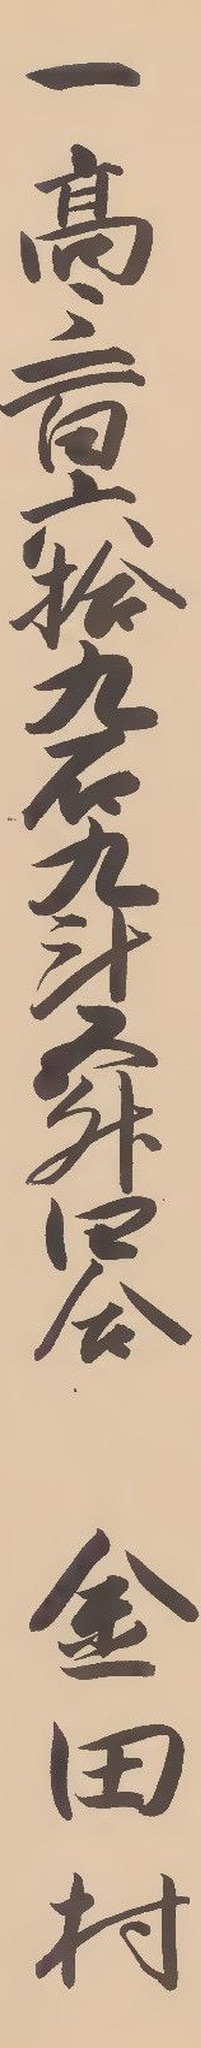一高三百六拾九石九斗五升四合金田村
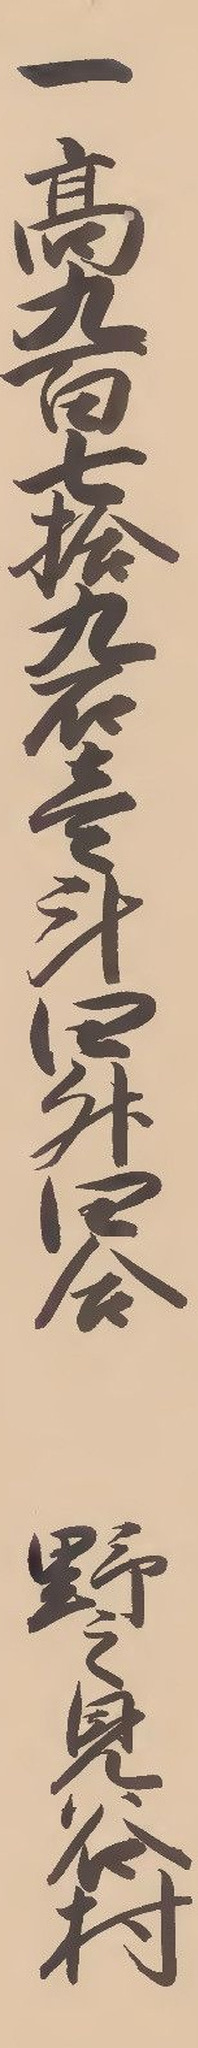一高九百七拾九石壱斗四升四合野之見谷村
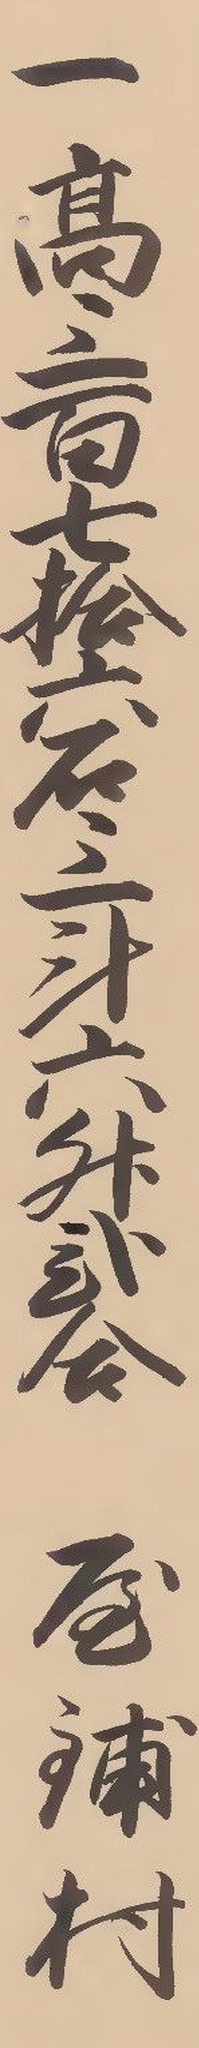一高三百七拾六石三斗六升弐合屋鋪村
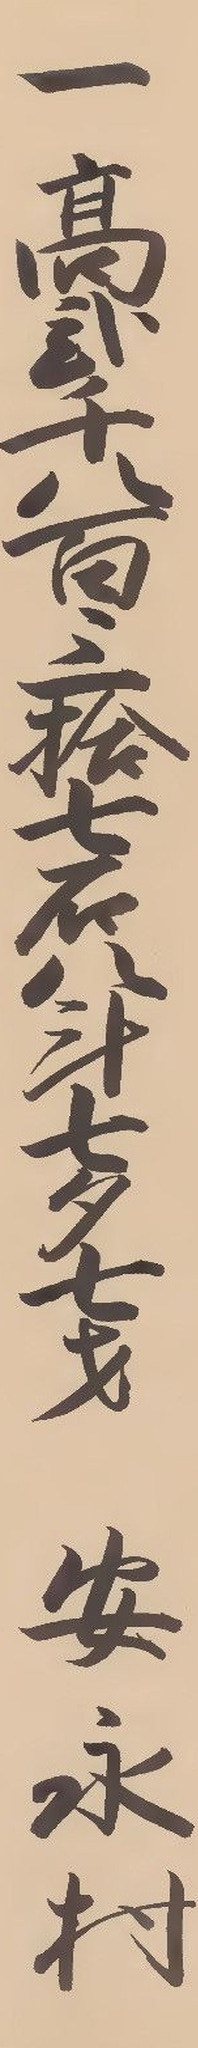一高弐千八百三拾七石八斗七勺七才安永村
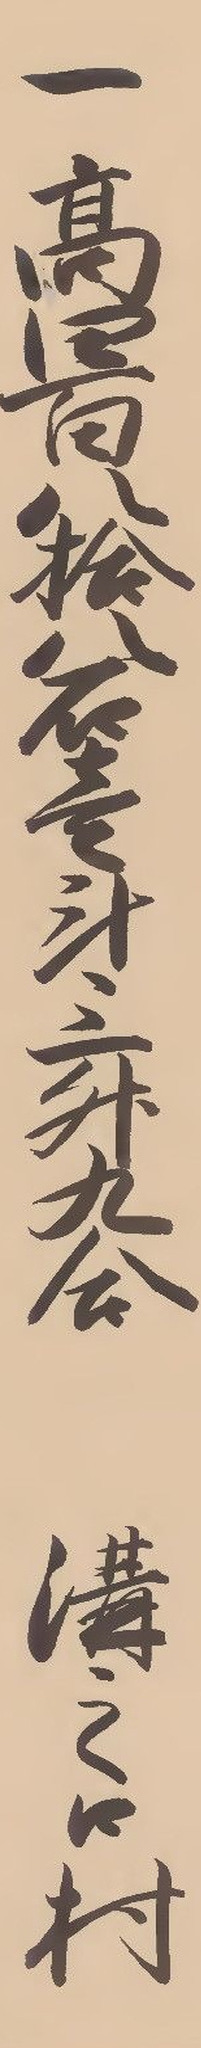一高四百八拾八石壱斗三升九合溝之口村
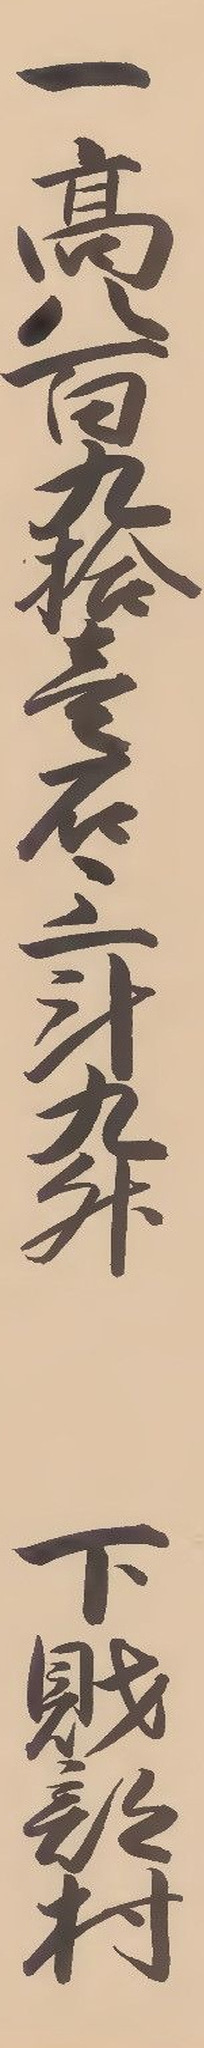一高八百九拾壱石三斗九升下財部村

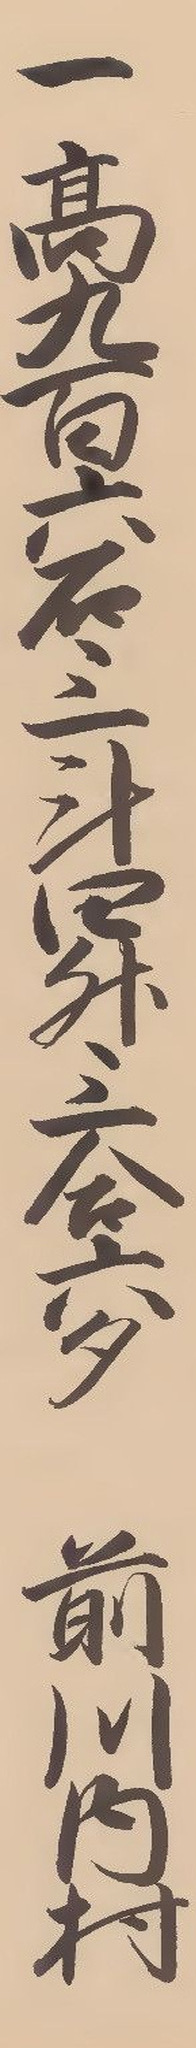一高九百六石三斗四升三合六勺前川内村
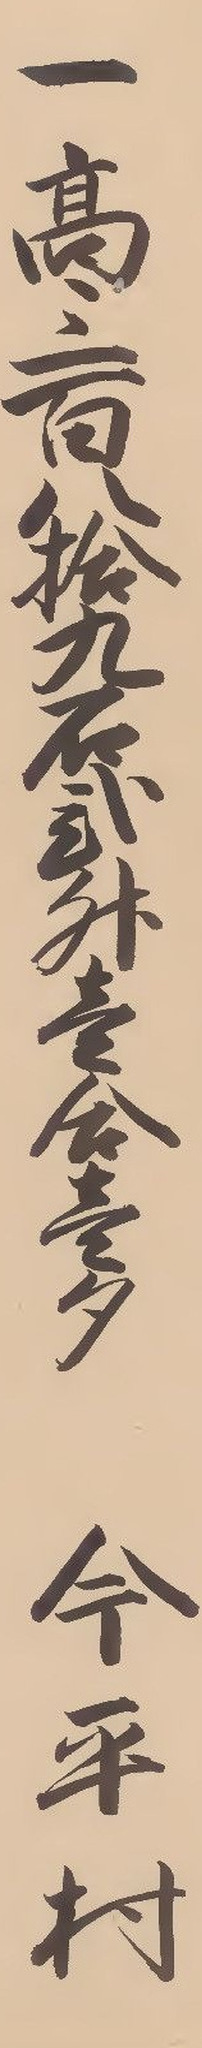一高三百八拾九石弐升壱合壱勺今平村
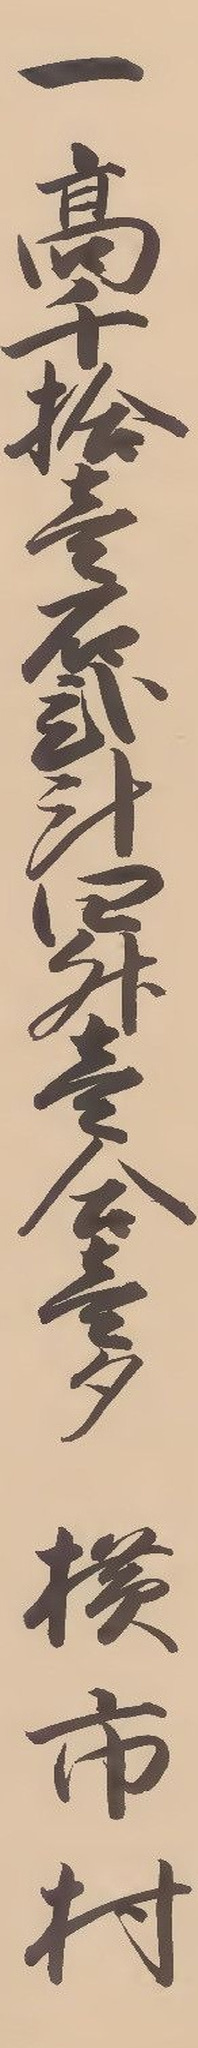一高千拾壱石弐斗四升壱合壱勺横市村
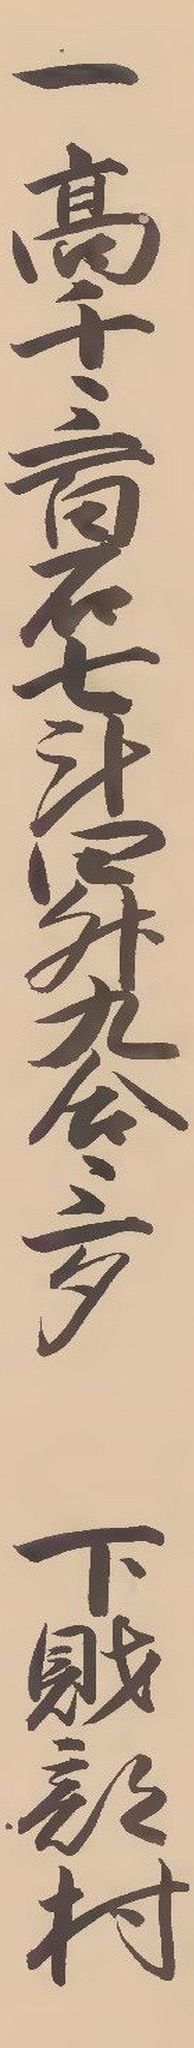一高千三百石七斗四升九合三勺下財部村
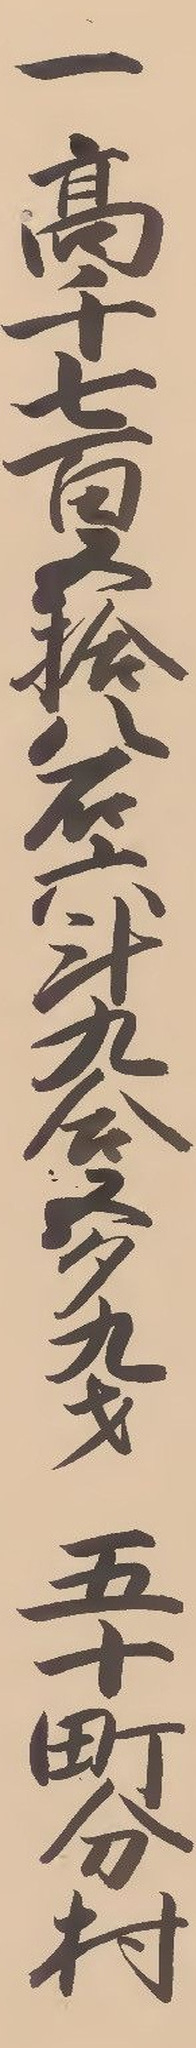一高千七百五拾八石六斗九合五勺九才五十町分村
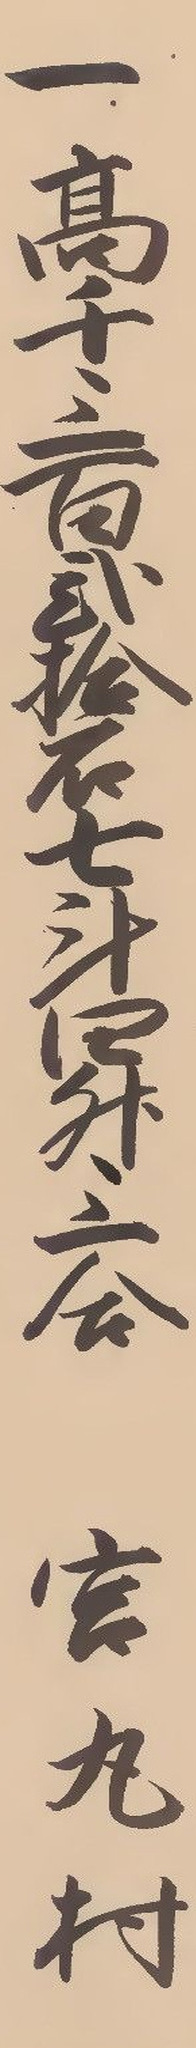一高千三百弐拾石七斗四升三合宮丸村
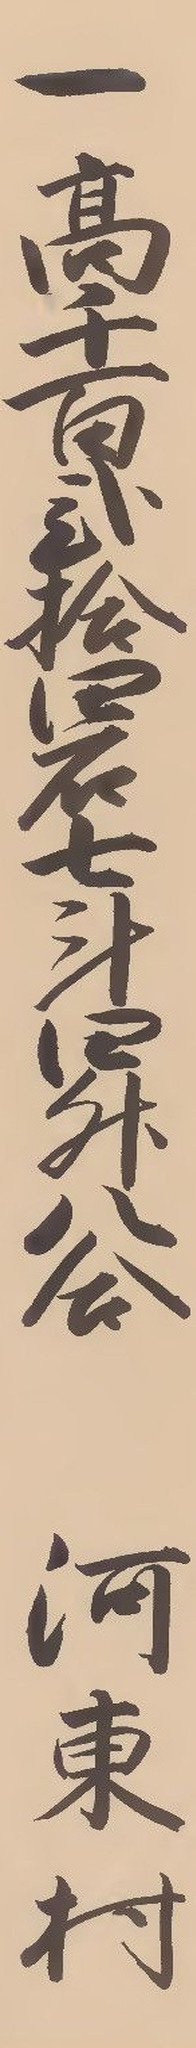一高千百弐拾四石七斗四升八合河東村
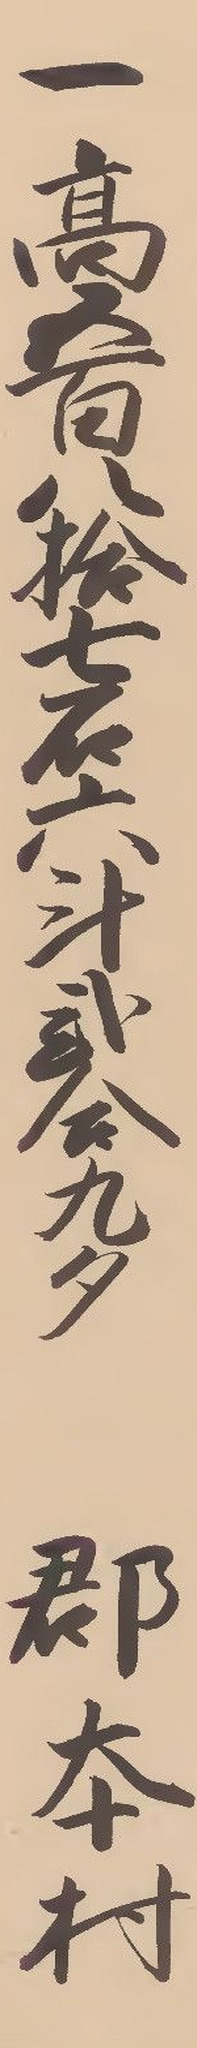一高五百八拾七石六斗弐合九勺郡本村
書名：日向国郷帳
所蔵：国立公文書館 National Archives of Japan
